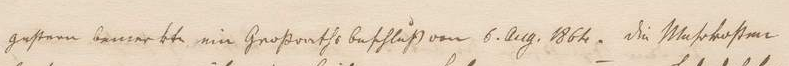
gestern bemerkte ein Großrathsbeschluß von 6. Aug. 1864. Die Mehrkosten
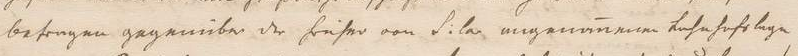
betragen gegenüber der früher von Silar angenommenen Bahnhofslage
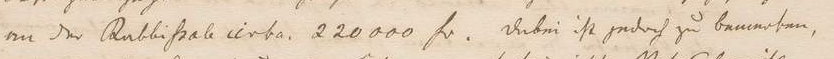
an der Rabbissale cirka. 220000 fr. Dabei ist jedoch zu bemerken,
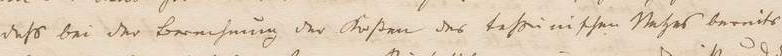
daß bei der Berechnung der Kosten des tessinischen Netzes bereits
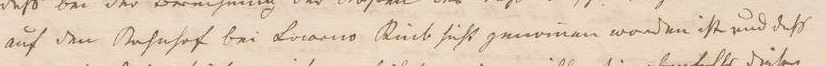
auf den Bahnhof bei Locarno Rücksicht genommen worden ist und daß
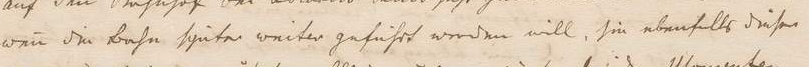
wenn die Bahn später weiter geführt werden will, sie ebenfalls dieser
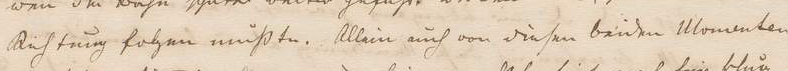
Richtung folgen müßte. Allein auch von diesen beiden Momenten
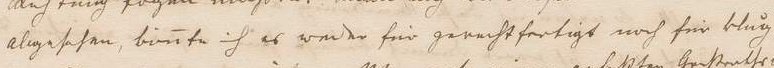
abgesehen, könnte ich es weder für gerechtfertigt noch für klug
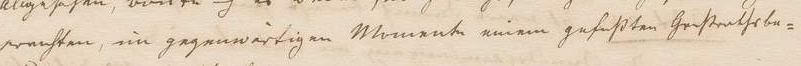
erachten, im gegenwärtigen Momente einem gefaßten Großrathsbe--
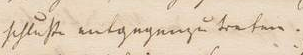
schluß entgegenzutreten.
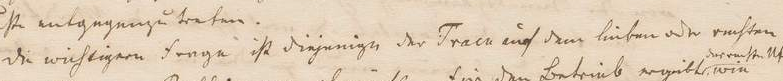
Die wichtigere Frage ist diejenige der Trace auf dem linken oder rechten
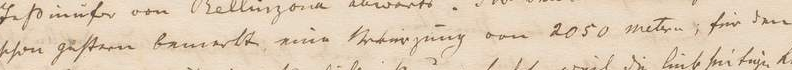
schon gestern bemerkt, eine Verkürzung von 2050 metern; für den
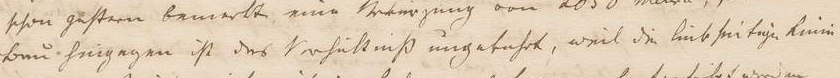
Bau hingegen ist das Verhältniß umgekehrt, weil die linkseitige Linie
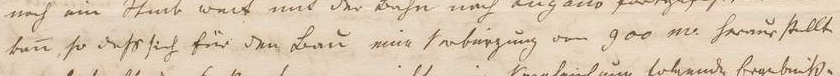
kann, so daß sich für den Bau eine Verkürzung von 900 m. herausstellt.
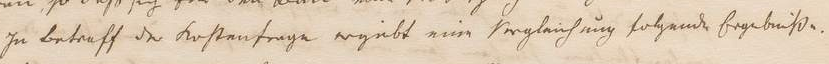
In Betreff der Kostenfrage ergibt eine Vergleichung folgende Ergebniße.
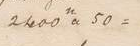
2400m a 50
